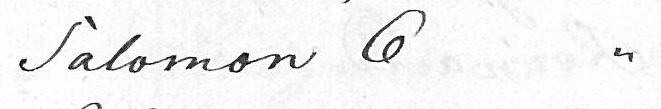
Salomon 6 "
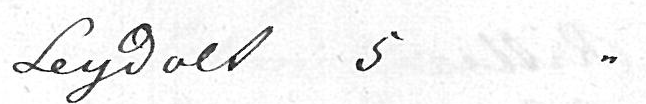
Leydolt 5 "
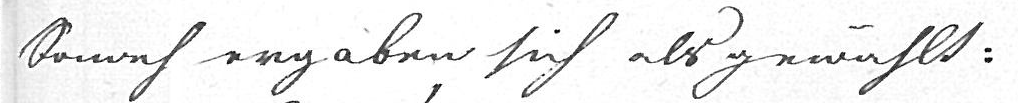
Sonach ergaben sich als gewählt:
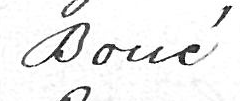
Boué
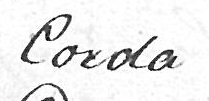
Corda
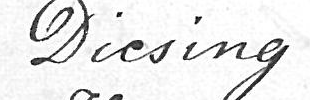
Diesing
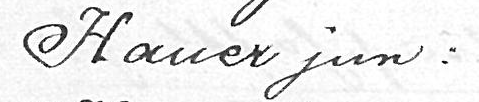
Hauer jun:
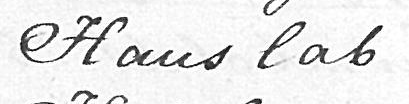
Hauslab
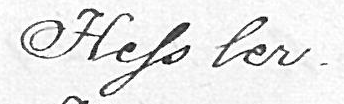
Hessler
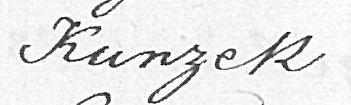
Kunzel
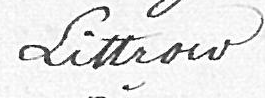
Littrow
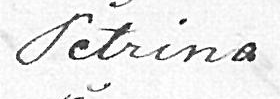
Petrina
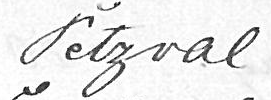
Petzval
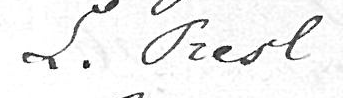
L. Presl
